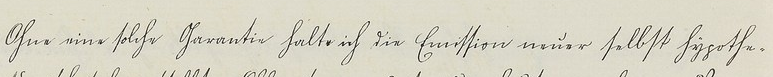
Ohne eine solche Garantie halte ich die Emission neuer selbst hypothe-
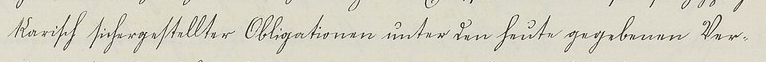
karisch sichergestellter Obligationen unter den heute gegebenen Ver-
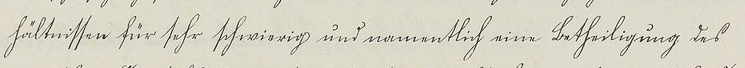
hältnissen für sehr schwierig und namentlich eine Betheiligung des
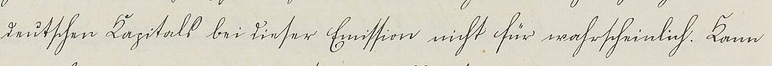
deutschen Kapitals bei dieser Emission nicht für wahrscheinlich. Kann
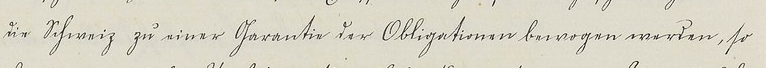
die Schweiz zu einer Garantie der Obligationen bewogen werden, so
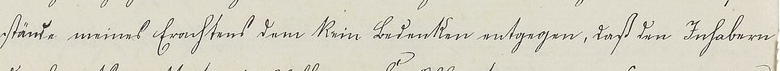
stände meines Erachtens dem kein Bedenken entgegen, daß den Inhabern
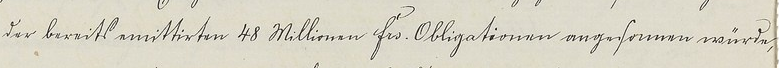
der bereits emittirten 48 Millionen Frs. Obligationen angesonnen würde,
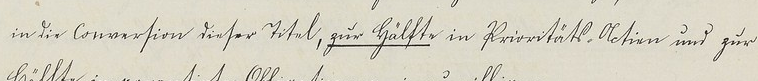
in die Conversion dieser Titel, zur Hälfte in Prioritäts-Actien und zur
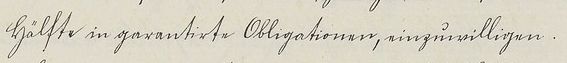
Hälfte in garantirte Obligationen, einzuwilligen.
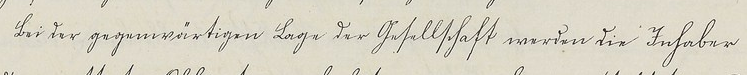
Bei der gegenwärtigen Lage der Gesellschaft werden die Inhaber
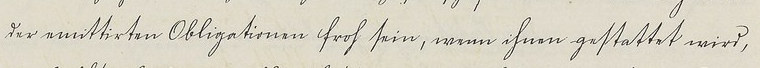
der emittirten Obligationen froh sein, wenn ihnen gestattet wird,
